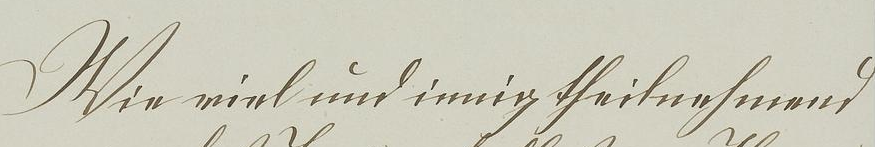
Wie viel und innig theilnehmend
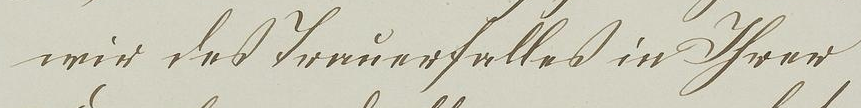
wir des Trauerfalles in Ihrer
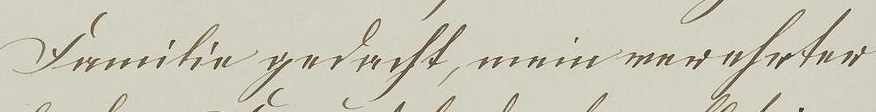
Familie gedacht, mein verehrter
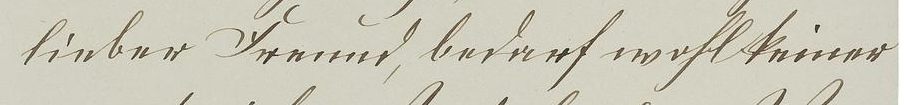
lieber Freund, bedarf wohl keiner
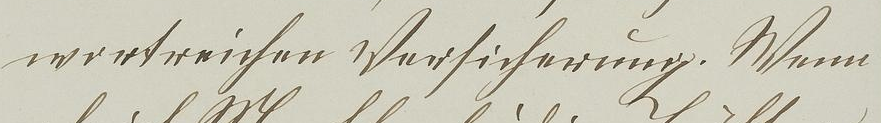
wortreichen Versicherung. Wenn
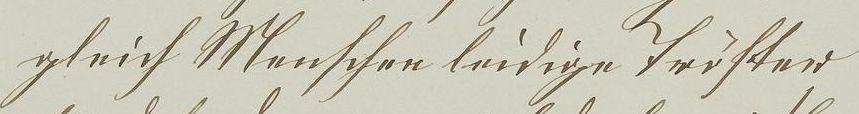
gleich Menschen leidige Tröster
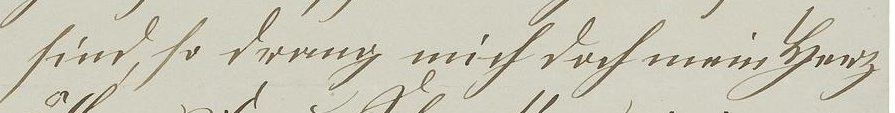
sind, so drang mich doch mein Herz
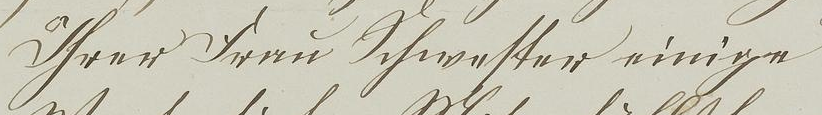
Ihrer Frau Schwester einige
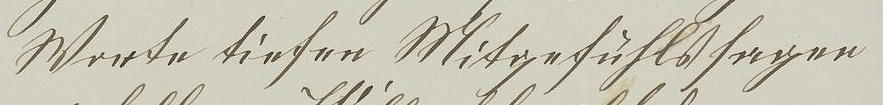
Worte tiefen Mitgefühls sagen
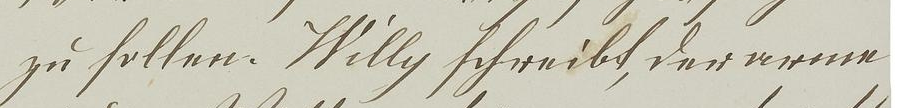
zu sollen. Willy schreibt, der arme
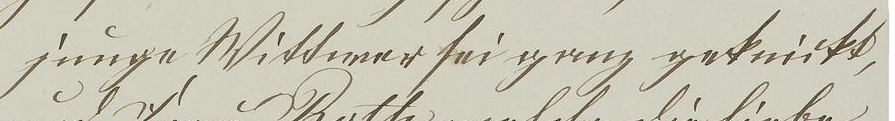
junge Wittwer sei ganz geknickt,
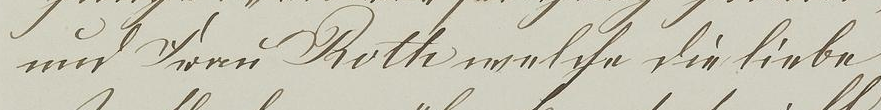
und Frau Roth welche die liebe
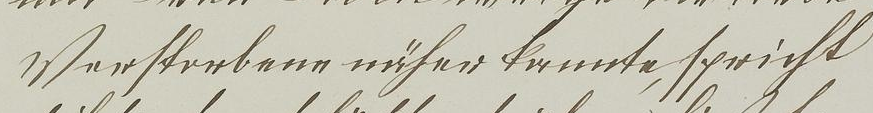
Verstorbene näher kannte, spricht
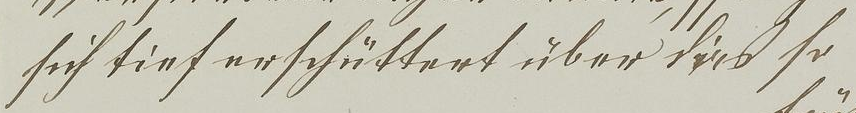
sich tief erschüttert über dies so
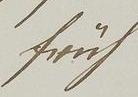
früh
